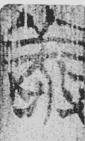敬
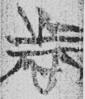者
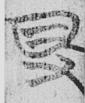○（得）
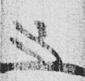之
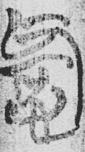○（怠）
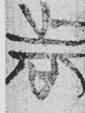者
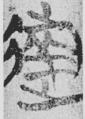○（失）
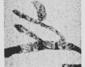之
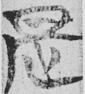是
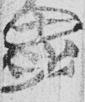{胃刀}（謂）
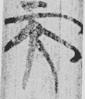天
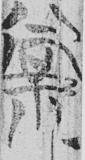○（常）
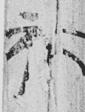天
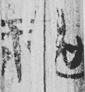神
